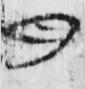月
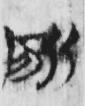所
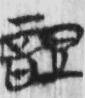○（屬）
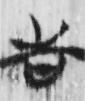告
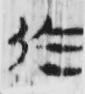於
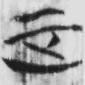正
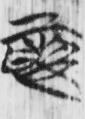婁
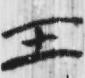壬
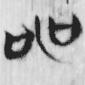申
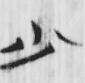少
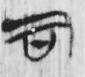司
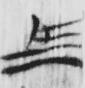馬
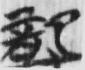龔
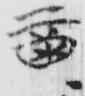梄
